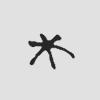木
